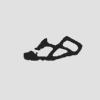凶
